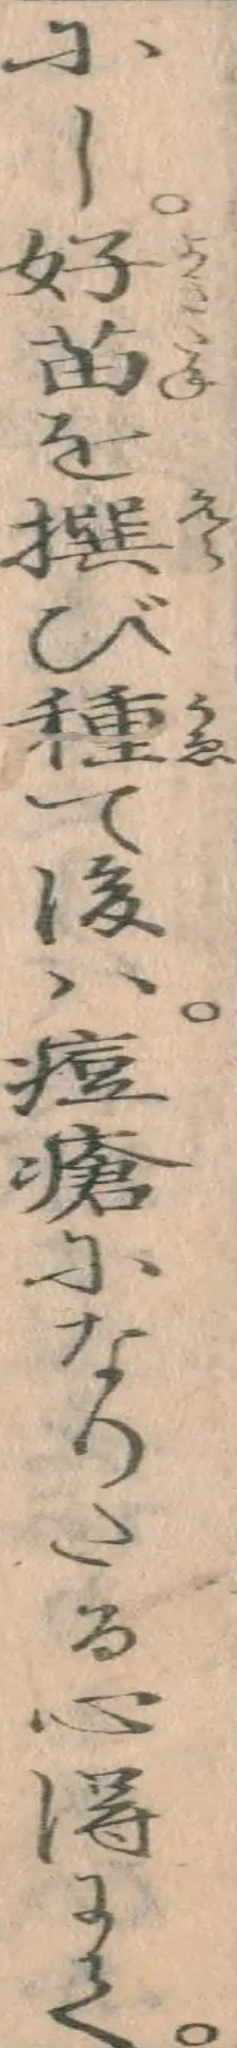にし。好苗を撰び種て後は。痘瘡になりたる心得にて。
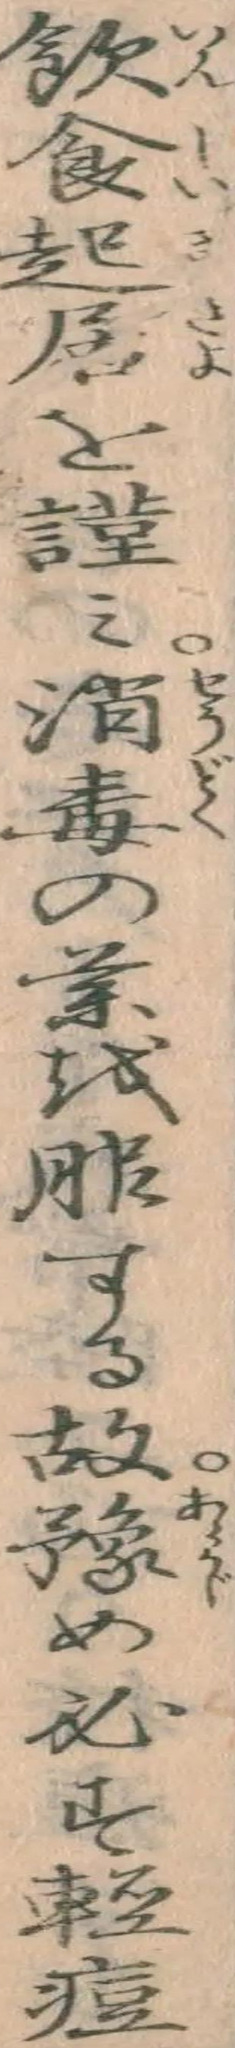飲食起居を謹み。消毒の薬を服する故。予め必す軽痘
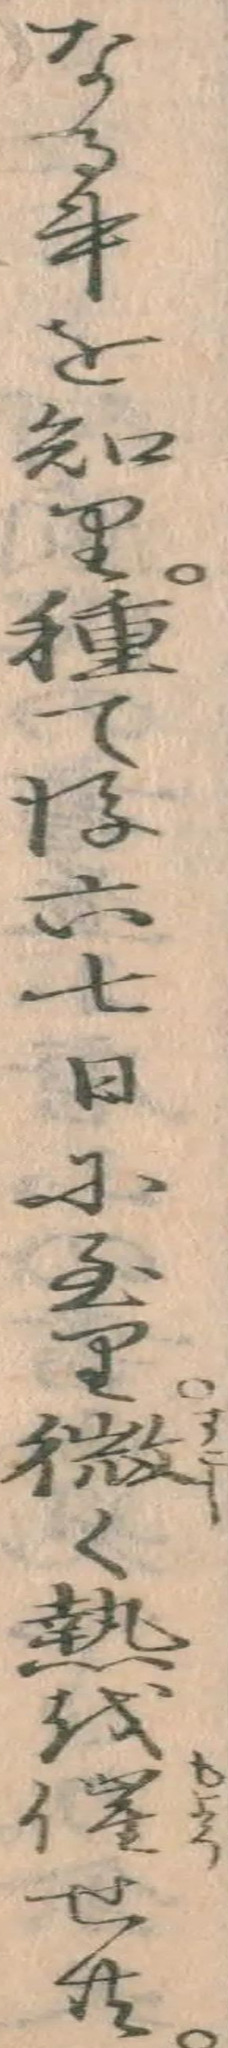なる事を知り。種て後六七日に至り。微く熱を催せ共。
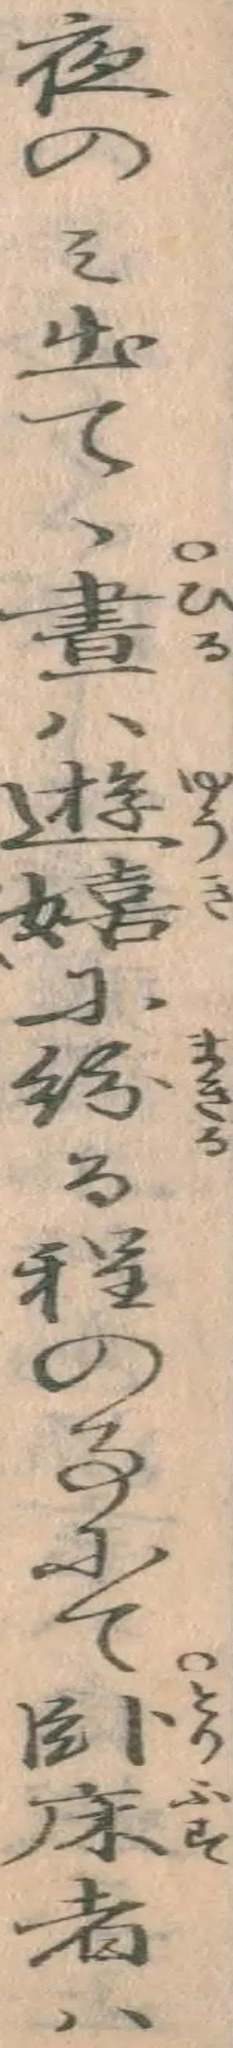夜のみ出てゝ。昼は遊嬉に紛る程の事にて。臥床者は
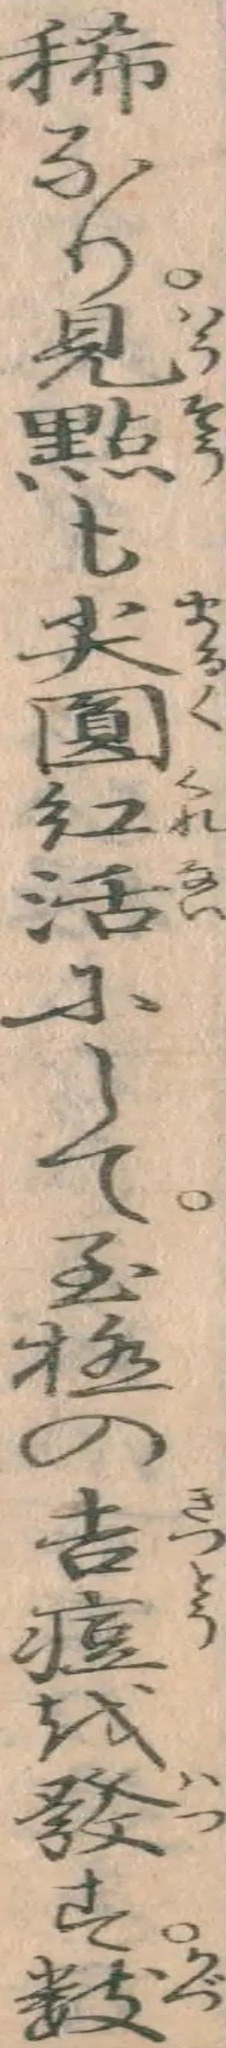稀なり。見点も尖円紅活にして。至極の吉痘を発す。数
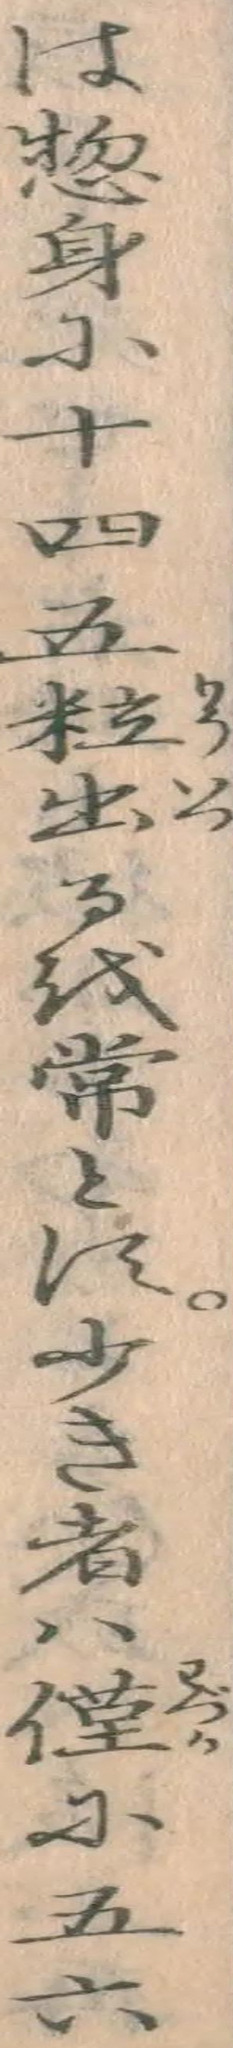は惣身に十四五粒出るを常とす。少き者は僅に五六
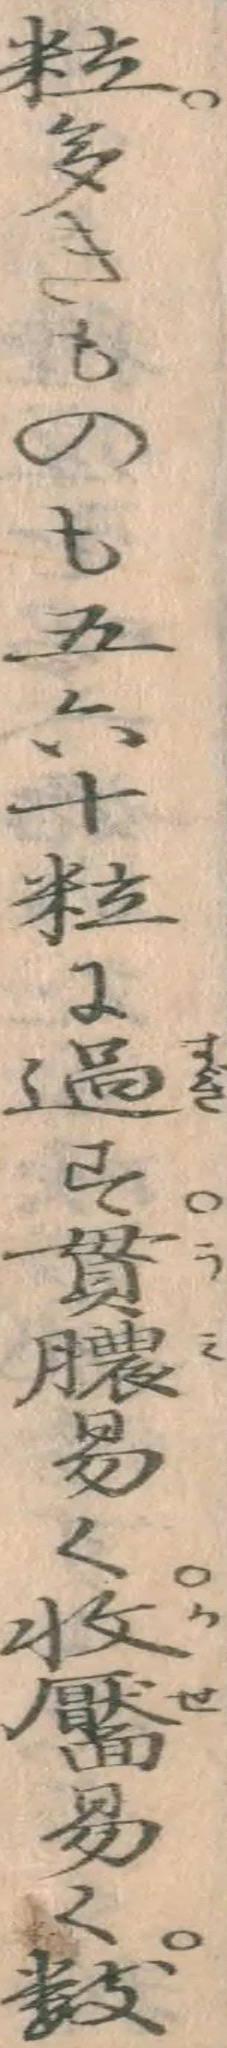粒。多きものも五六十粒に過す。貫膿易く。収靨易く。数
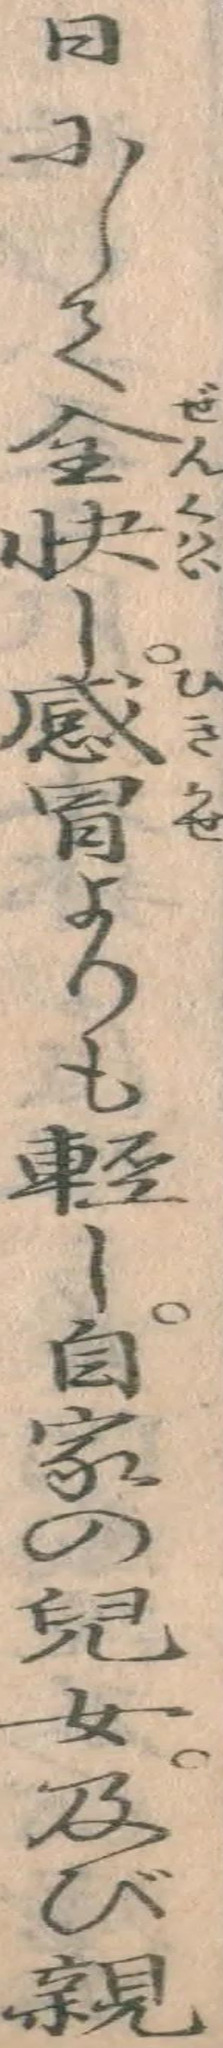日にして全快し。感冒よりも軽し。自家の児女。及び親
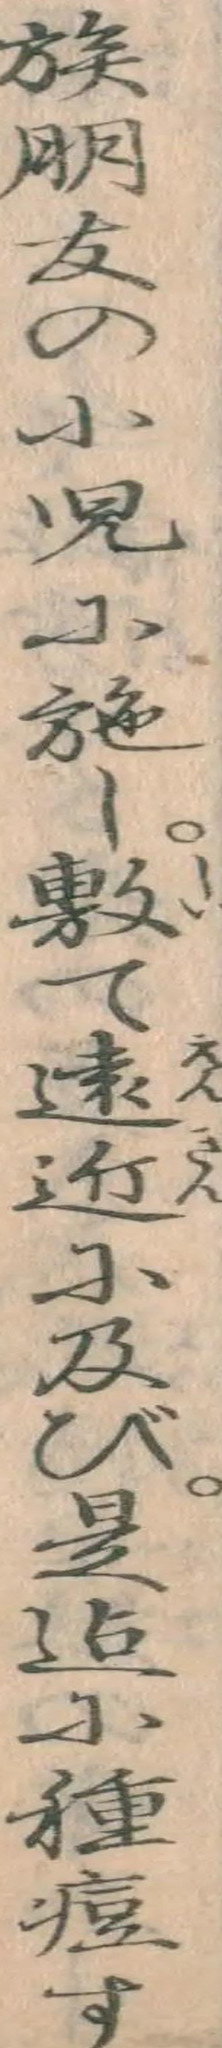族朋友の小児に施し。敷て遠近に及び。是迄に種痘す
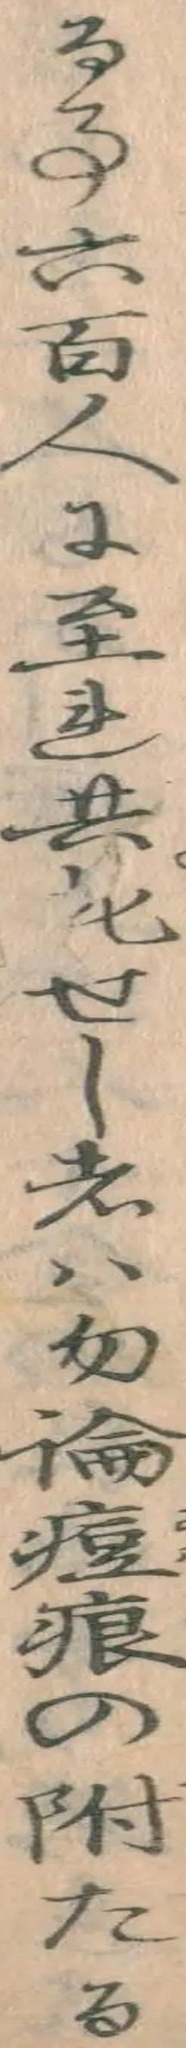る事六百人に至れ共。死せし者は勿論。痘痕の附たる

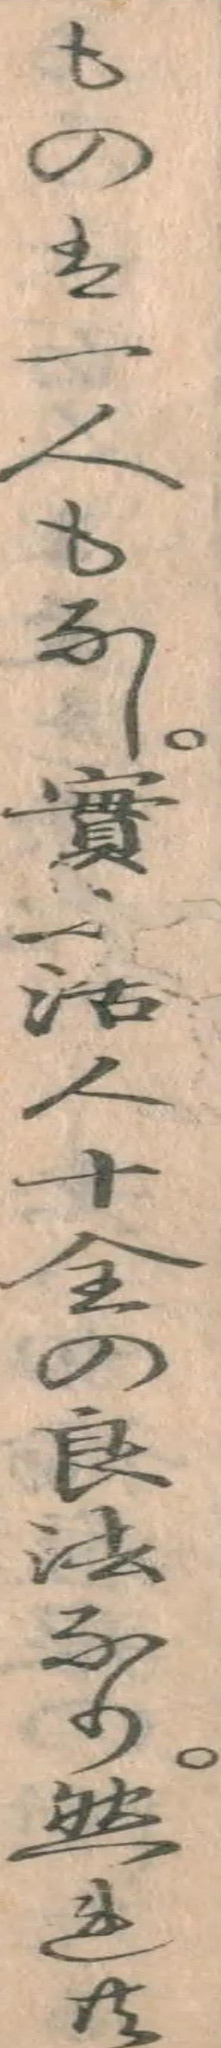ものは一人もなし。実に活人十全の良法なり。然れ共
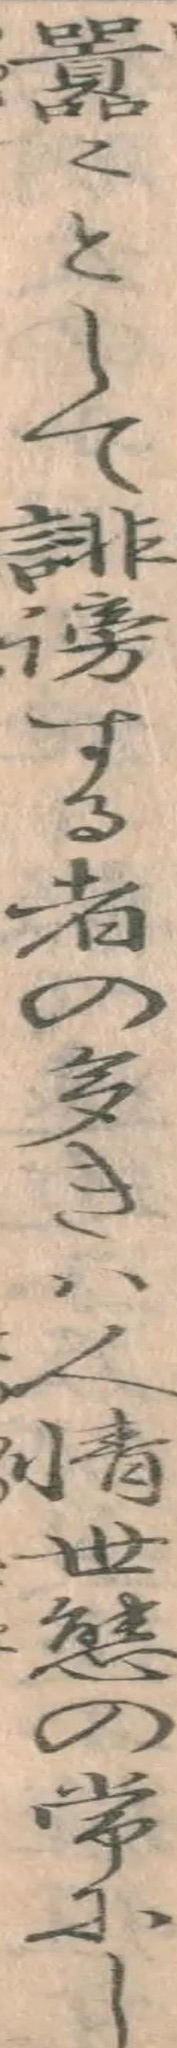囂々として誹謗する者の多きは。人情世態の常にし
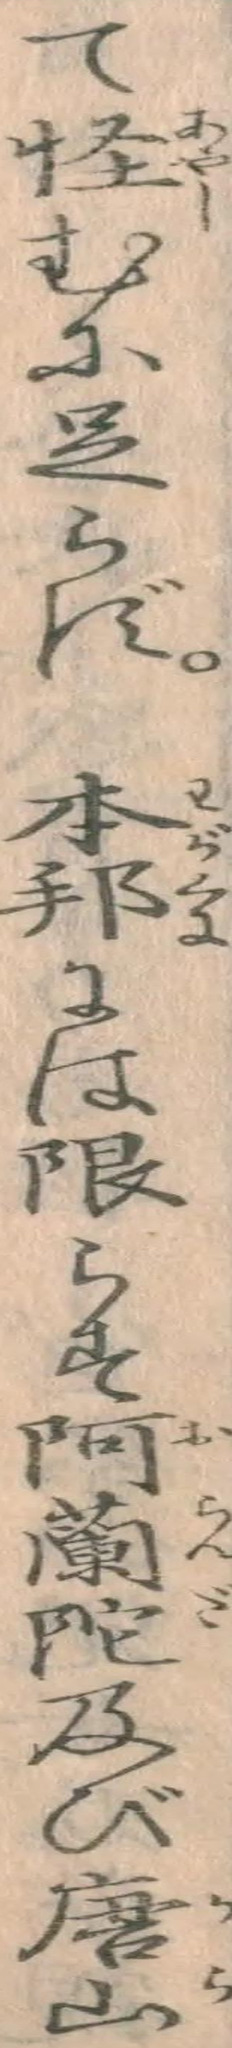て怪むに足らず。本邦には限らす阿蘭陀及び唐山
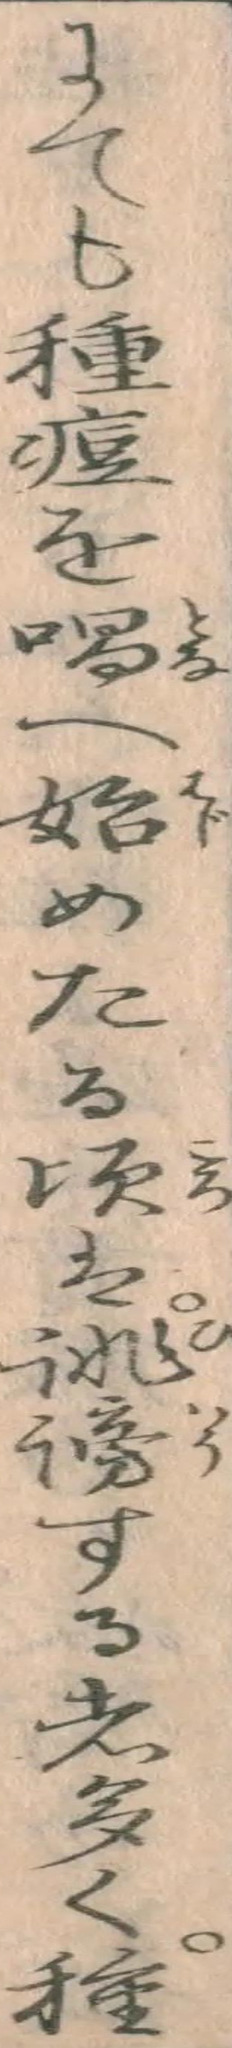にても種痘を唱へ始めたる頃は。誹謗する者多く。種
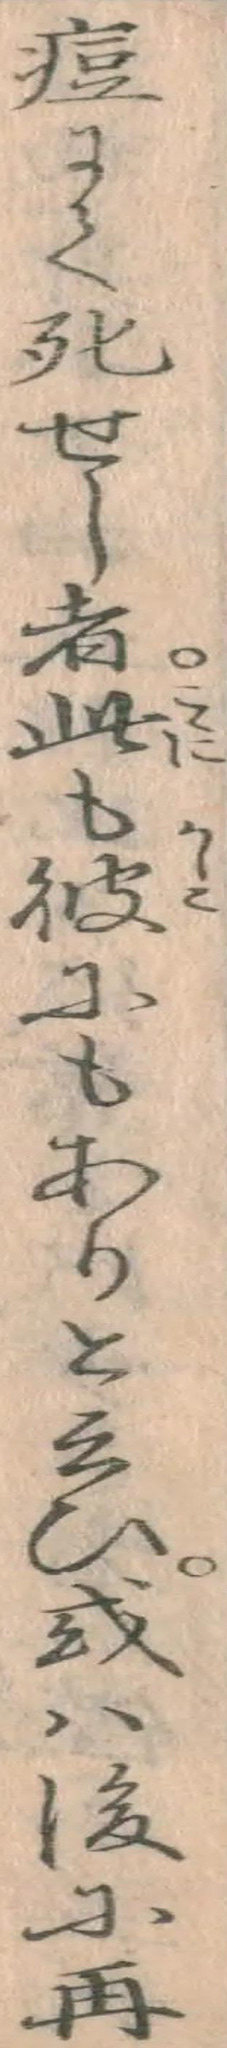痘にて死せし者。此も彼にもありと云ひ。或は後に再
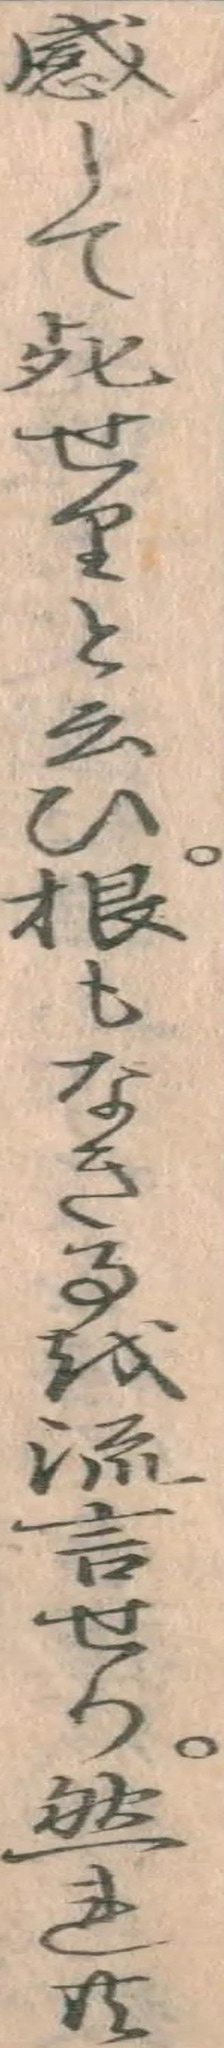感して死せりと云ひ。根もなき事を流言せり。然れ共
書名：種痘活人十全辯
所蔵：国立国会図書館 National Diet Library, JAPAN
